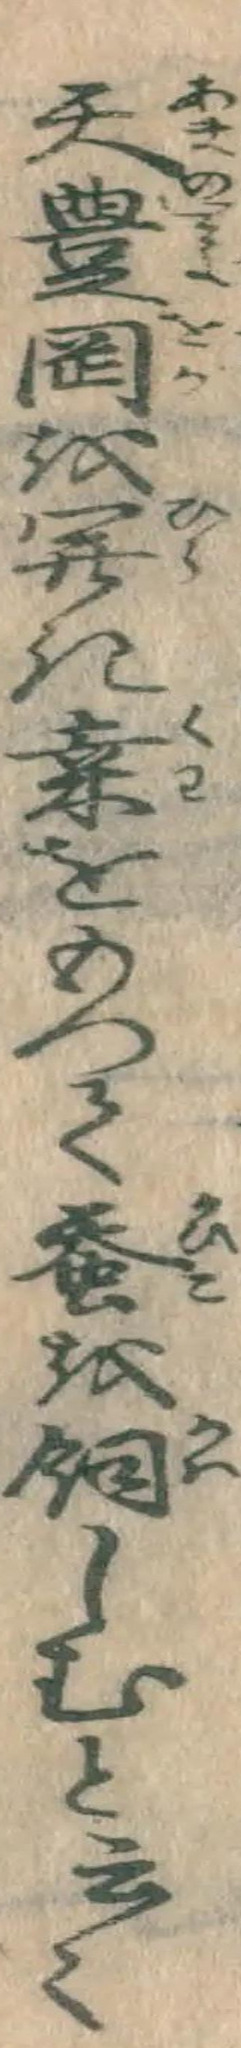天豊岡を開き桑をもつて蚕を飼しむと云々

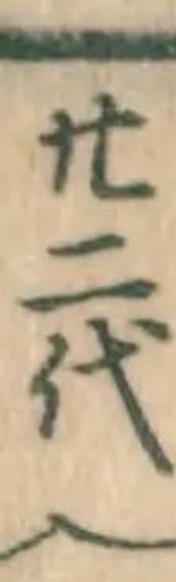廿二代
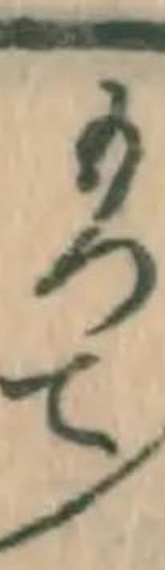もつて
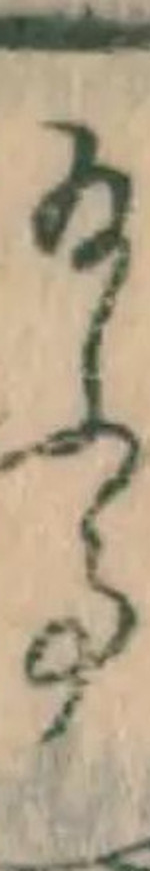給ふ事
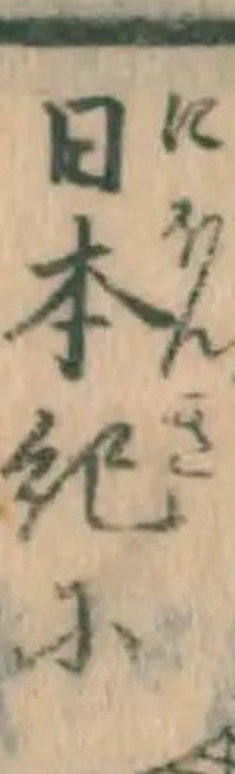日本紀に
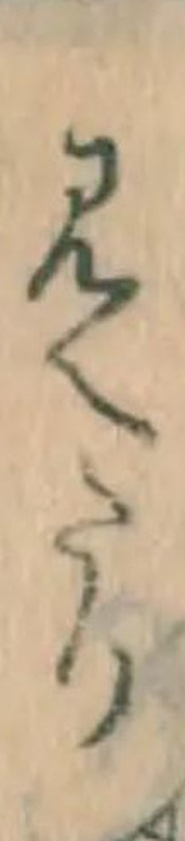見へたり

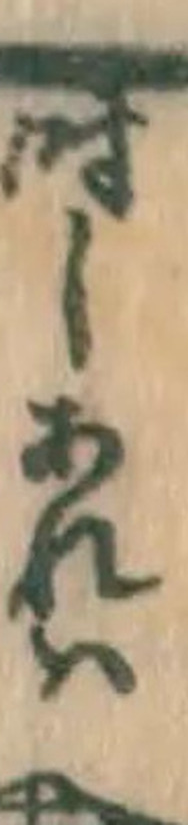時しあれは
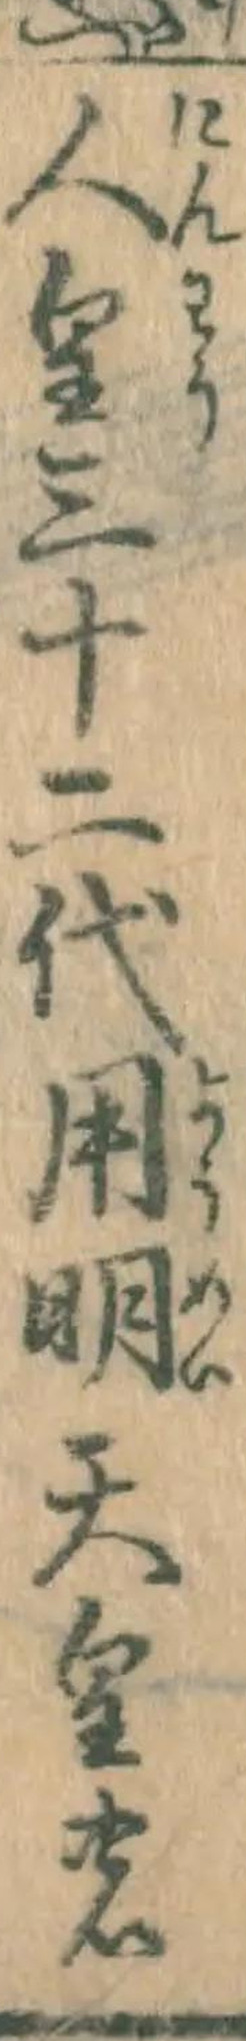人皇三十二代用明天皇の
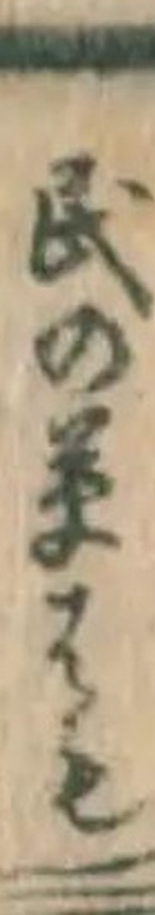民の草はも
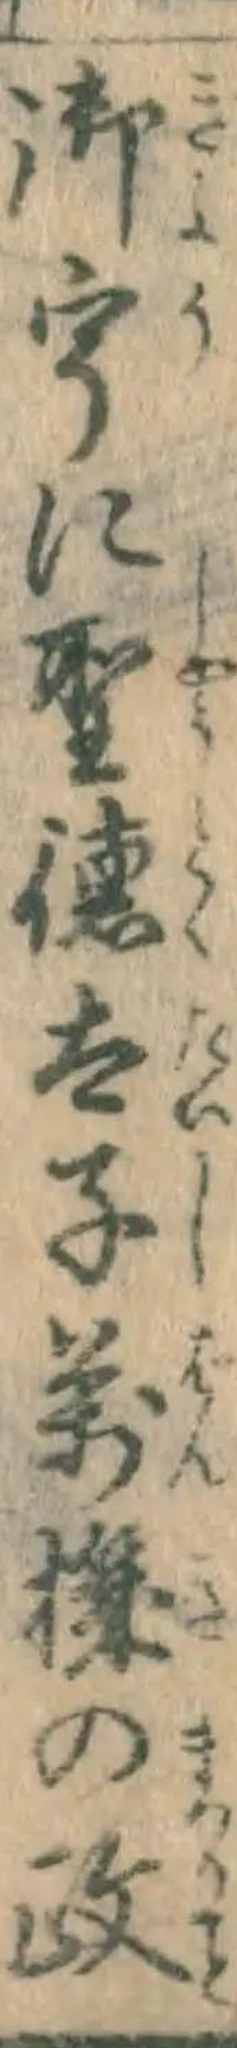御宇に聖徳太子万機の政
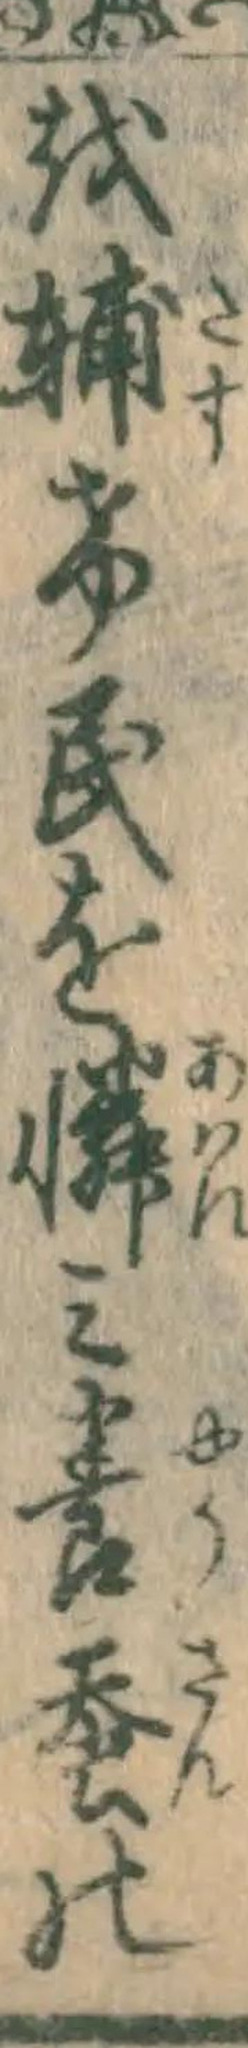を輔け民を憐み養蚕の
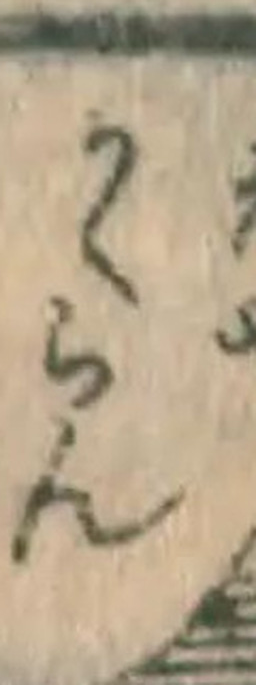かくらん
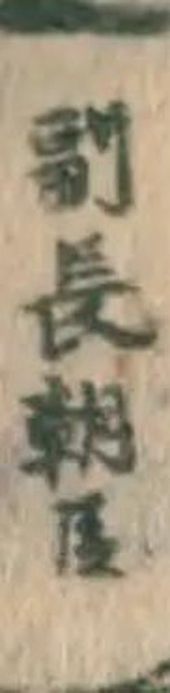副長朝臣
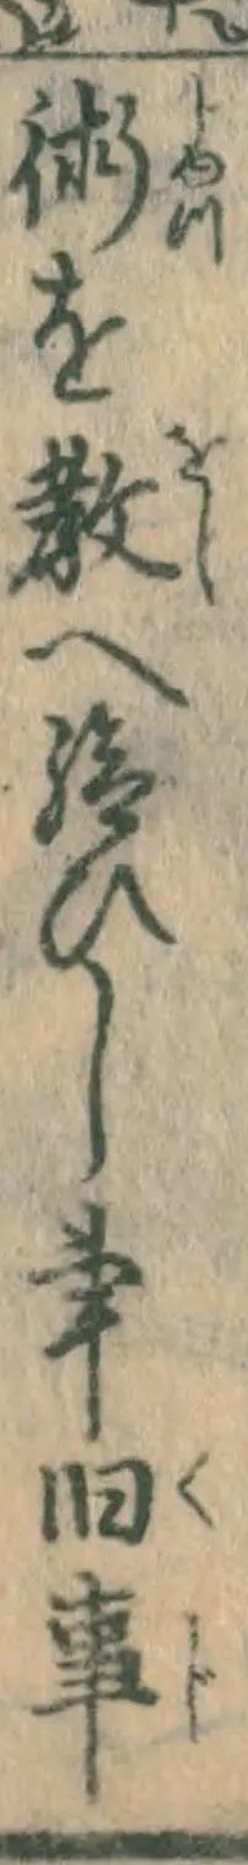術を教へ給ひし事旧事
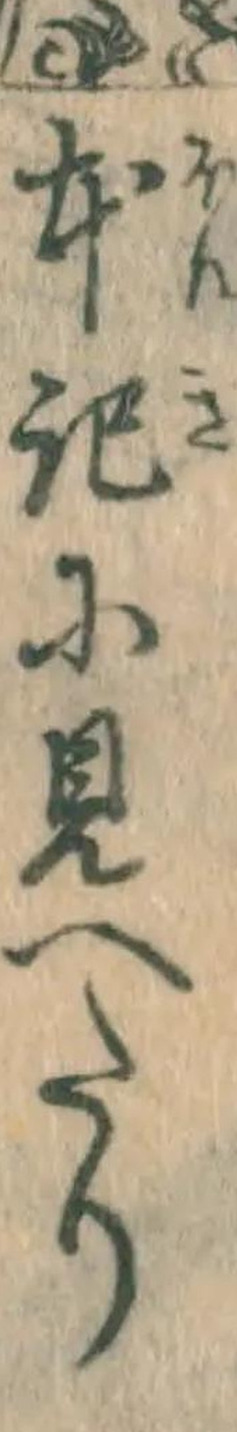本記に見へたり
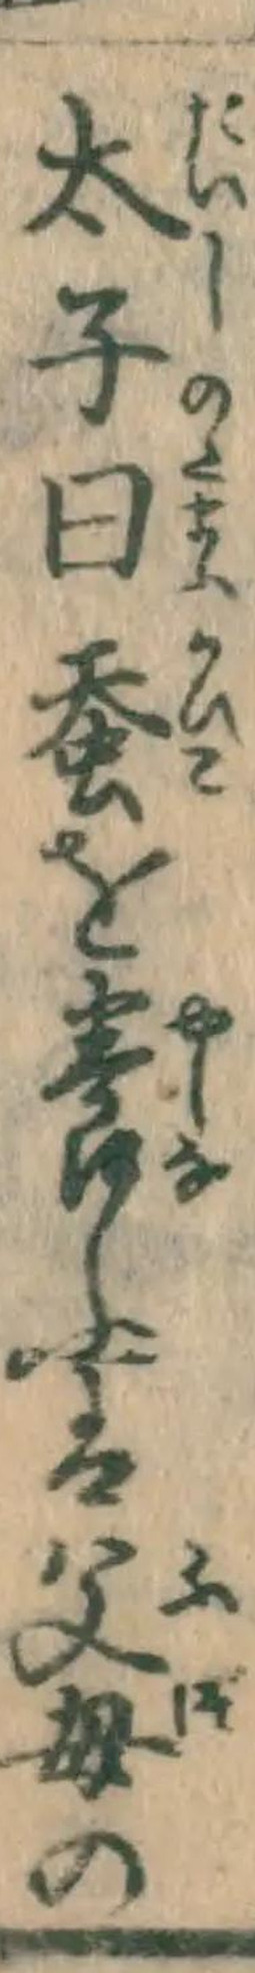太子曰蚕を養ふは父母の
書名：養蚕秘録 3巻. [1]
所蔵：国立国会図書館 National Diet Library, JAPAN
